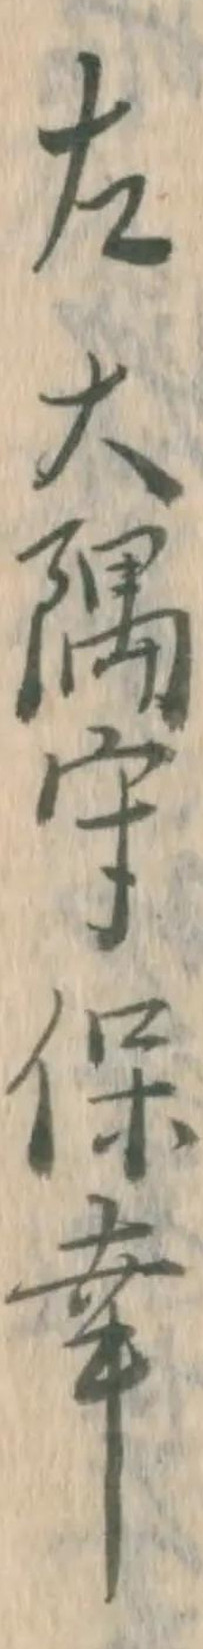左大隅守保幸
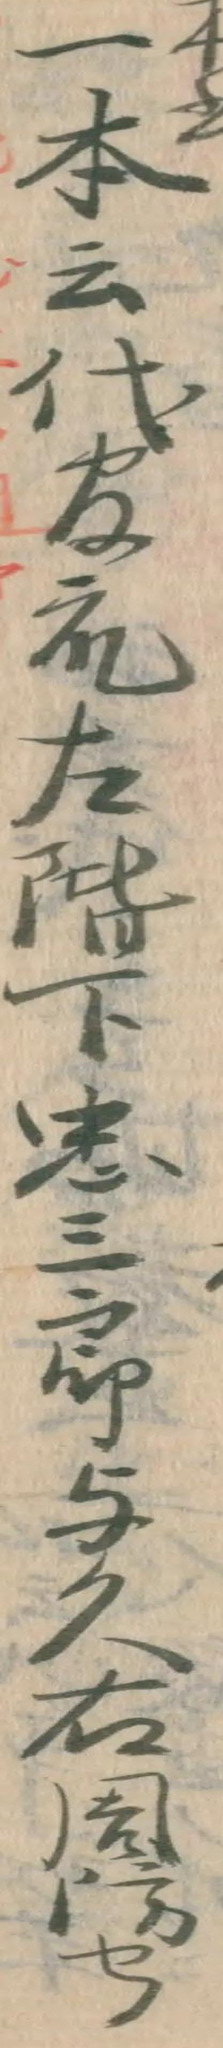一本云代官衆左階下忠三郎与久右周防守
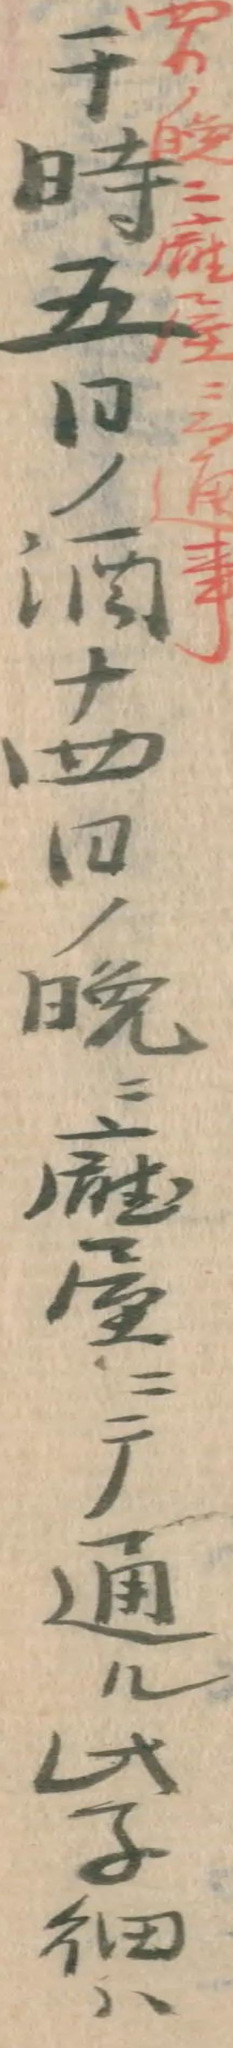于時五日ノ酒十四日ノ晩ニ庁屋ニテ通ル此子細ハ
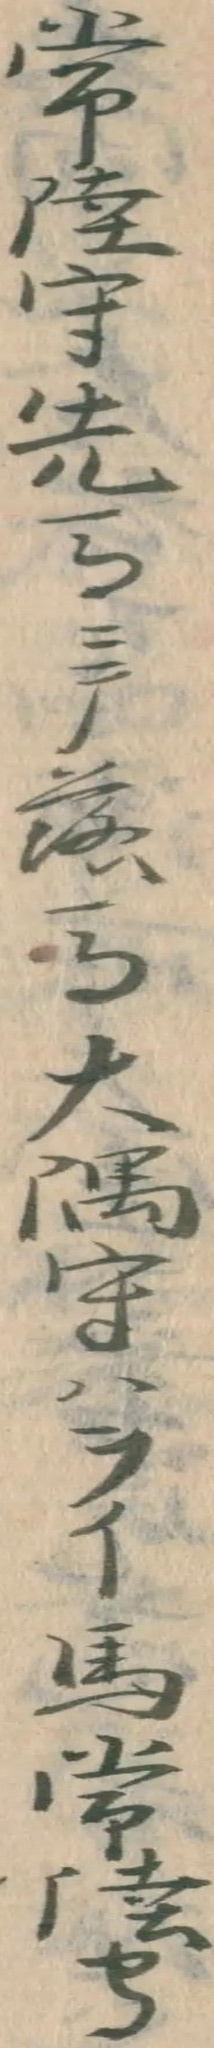常陸守先馬ニテ落馬大隅守ハヲイ馬常陸守
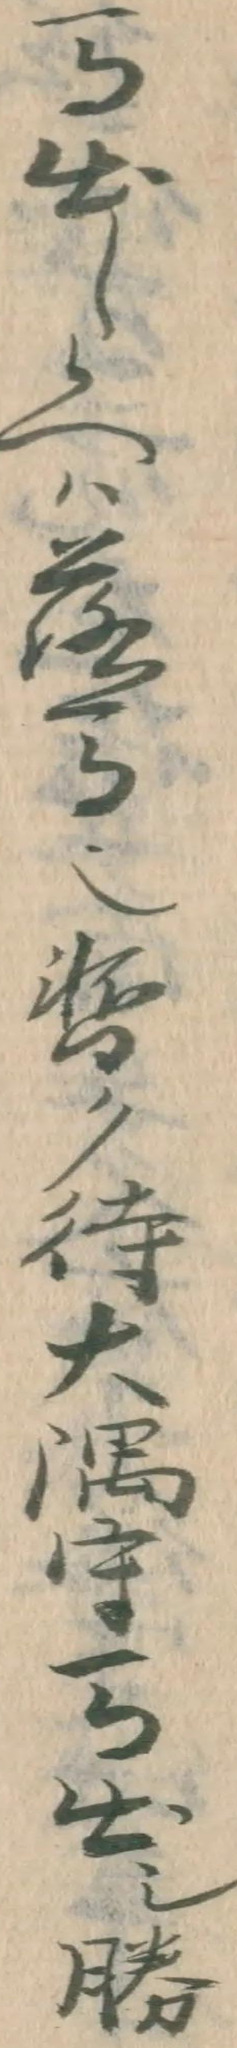馬出し候へハ落馬也暫ク待大隅守馬出シ勝
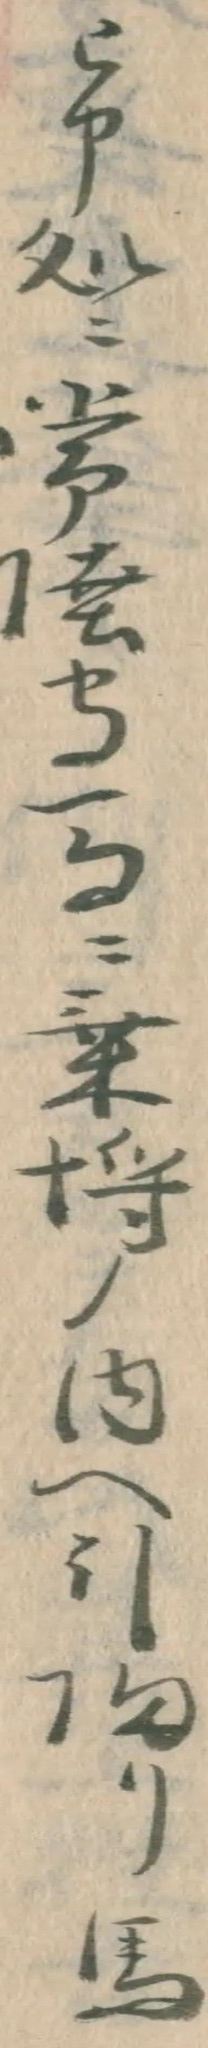被申処ニ常陸守馬ニ乗埒ノ内へ引帰リ馬
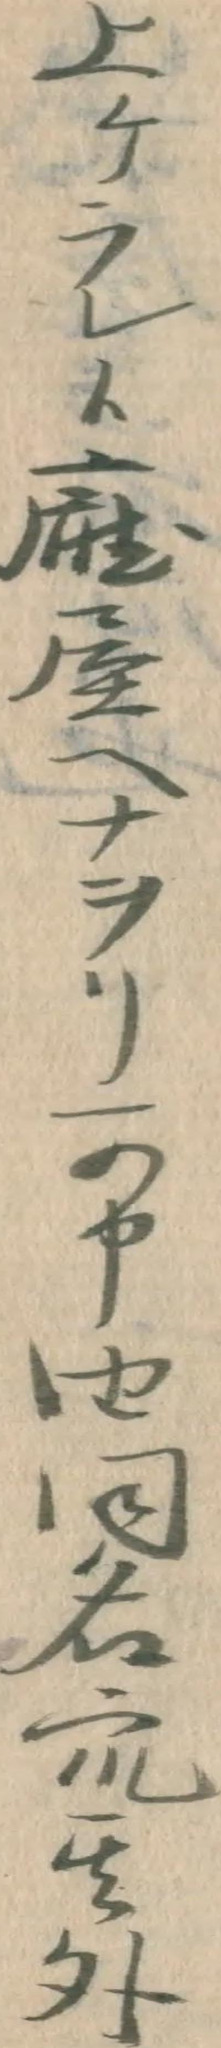上ケラレ候庁屋へナヲリ可申由同名衆其外
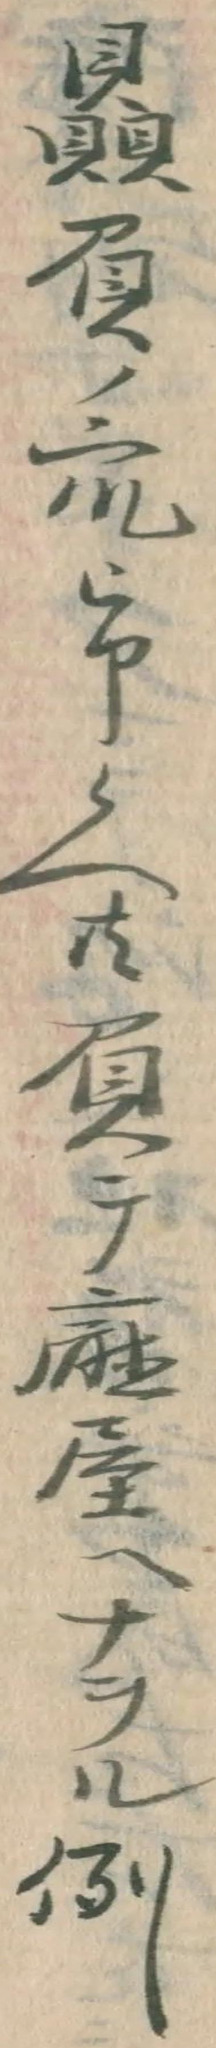贔屓ノ衆被申候へ共負テ庁屋へナヲル例
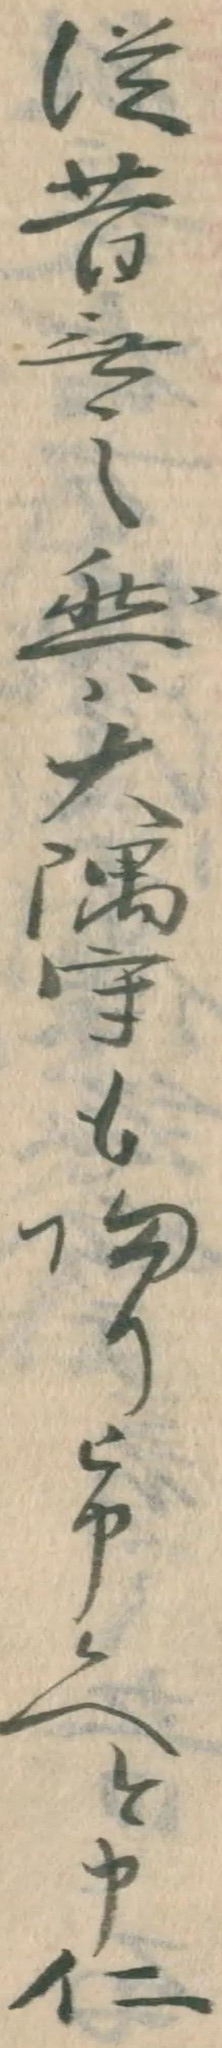従昔無之然ハ大隅守も帰り被申候へと申仁
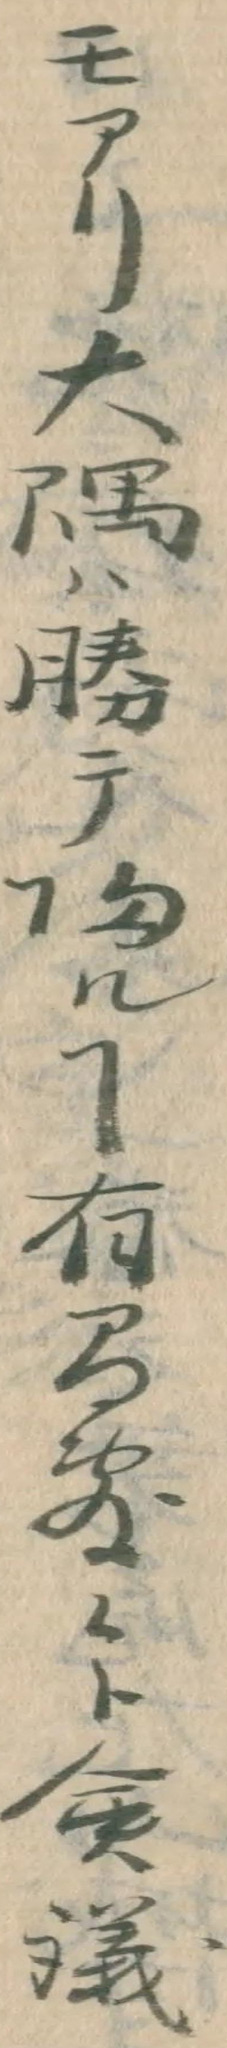モアリ大隅ハ勝テ帰ルコト有間敷候ト僉議
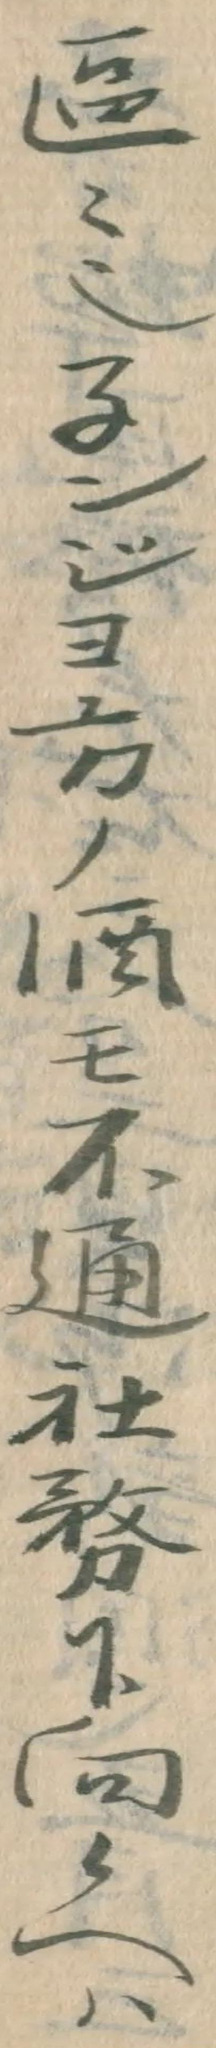区々也ネンジヨ方ノ酒モ不通社務下向候ヘハ
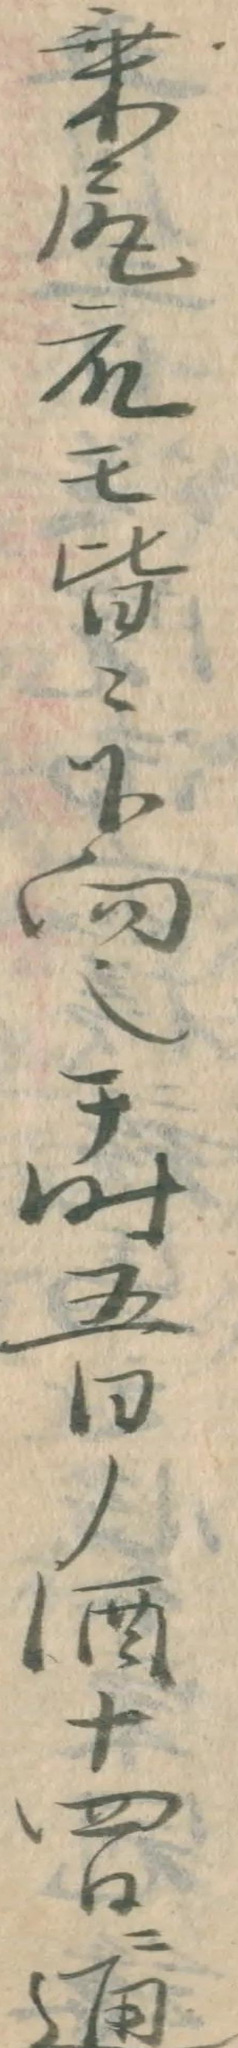乗尻衆モ皆々下向也其時五日ノ酒十四日ニ通
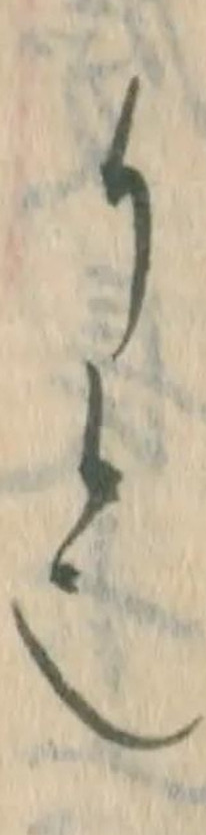り候也

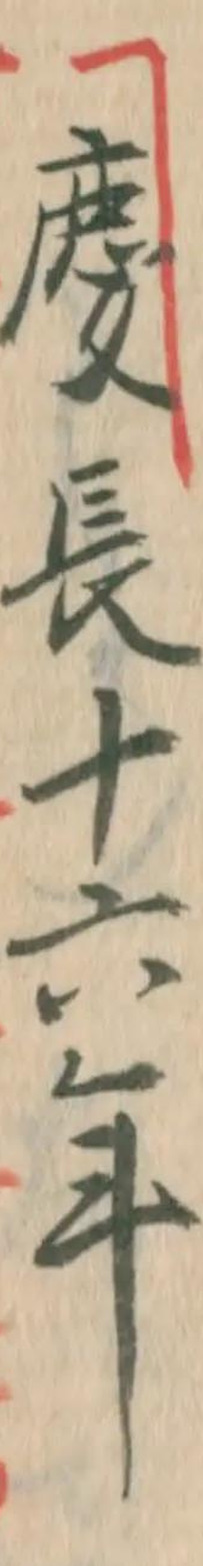慶長十六年
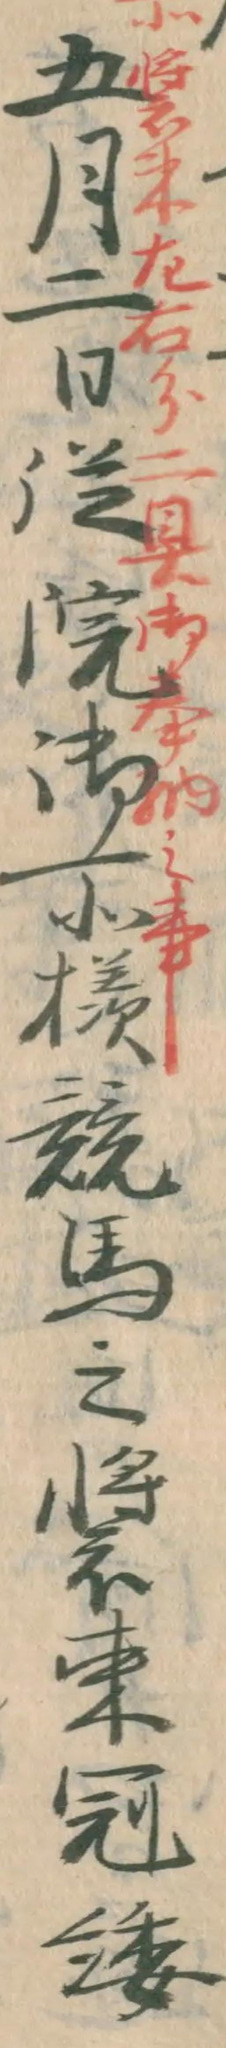五月二日従院御所様競馬之装束冠諉
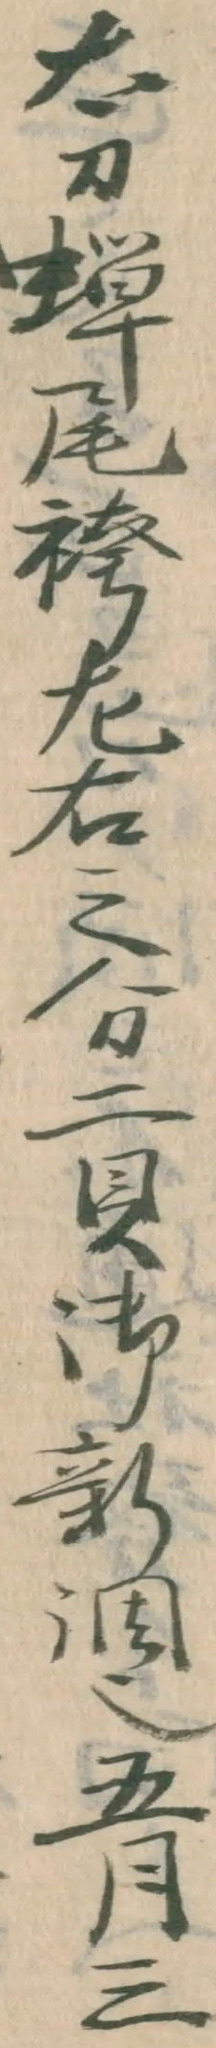太刀蝉尾袴左右之分二具御新調也五月三
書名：賀茂社記録. 第10冊
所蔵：国立国会図書館 National Diet Library, JAPAN
